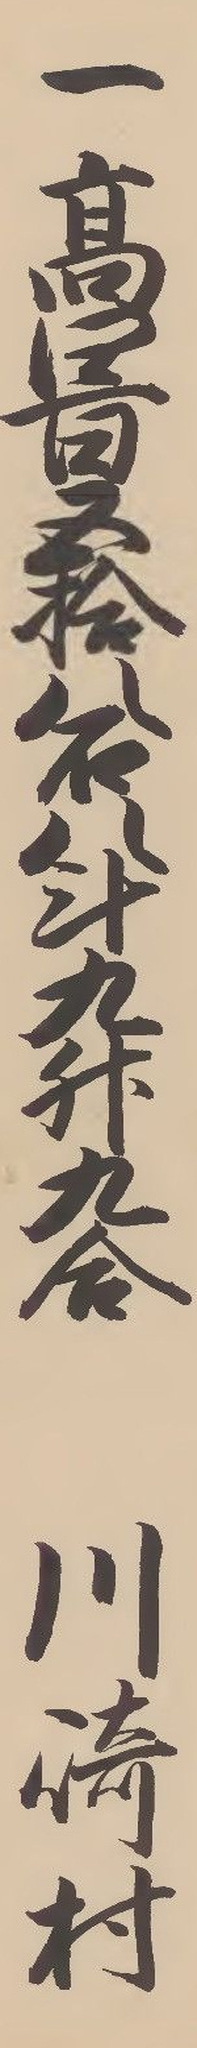一高四百五拾八石八斗九升九合川崎村

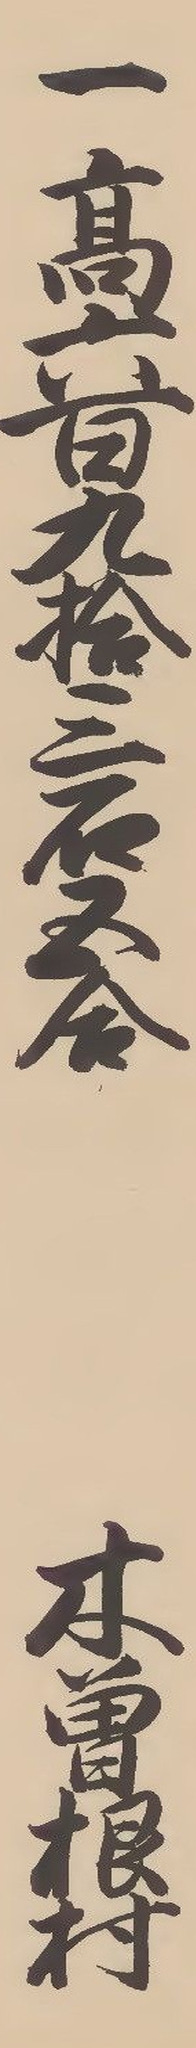一高六百九拾三石五合木曽根村
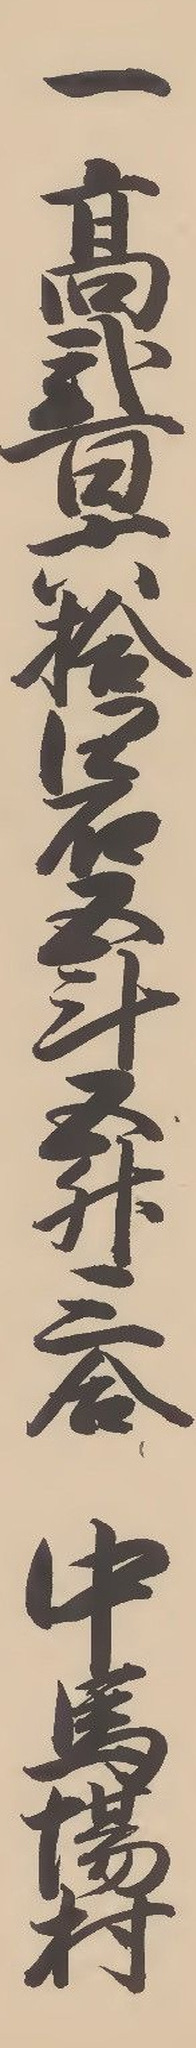一高弐百六拾四石五斗五升三合中馬場村
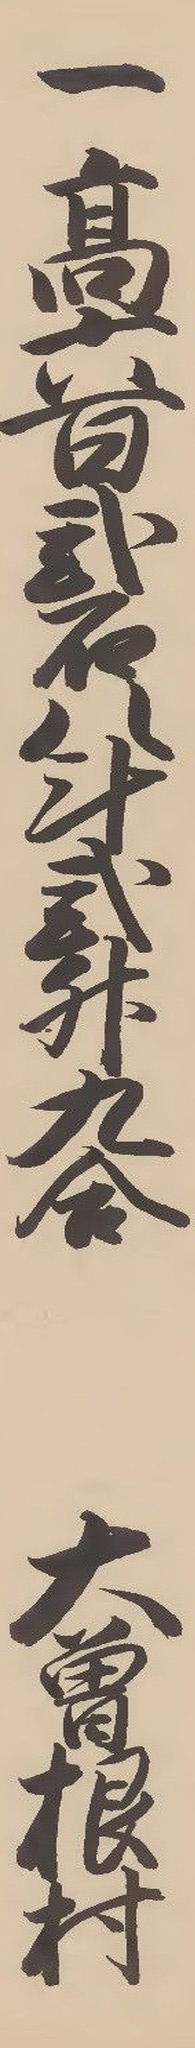一高六百弐石八斗弐升九合大曽根村
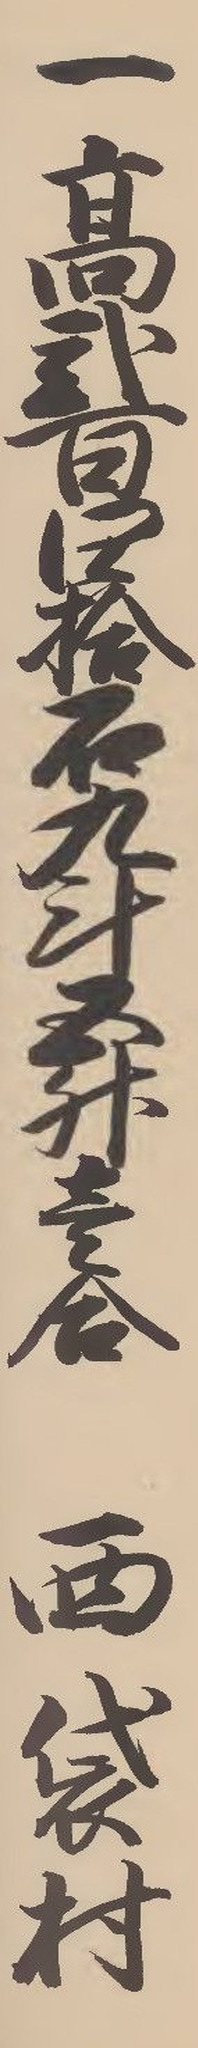一高弐百四拾石九斗五升壱合西袋村
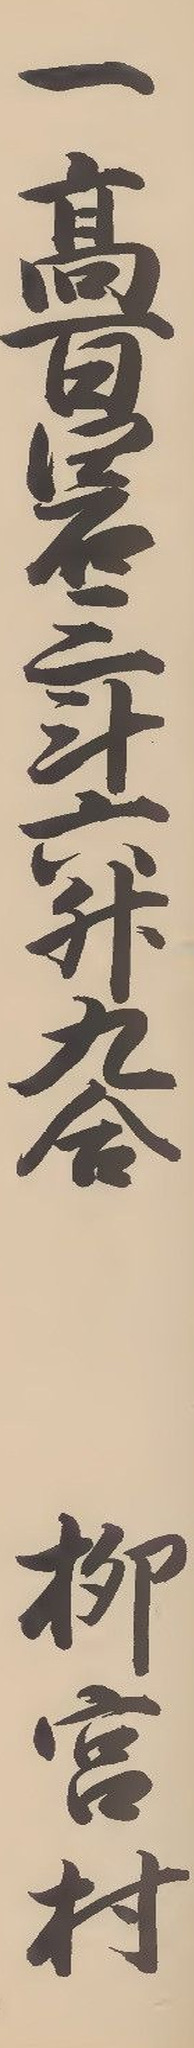一高百四石三斗六升九合柳宮村
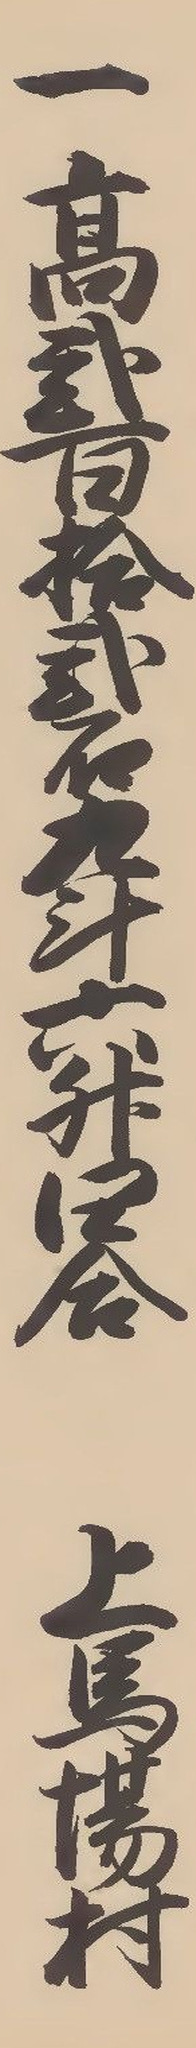一高弐百拾弐石九斗六升四合上馬場村
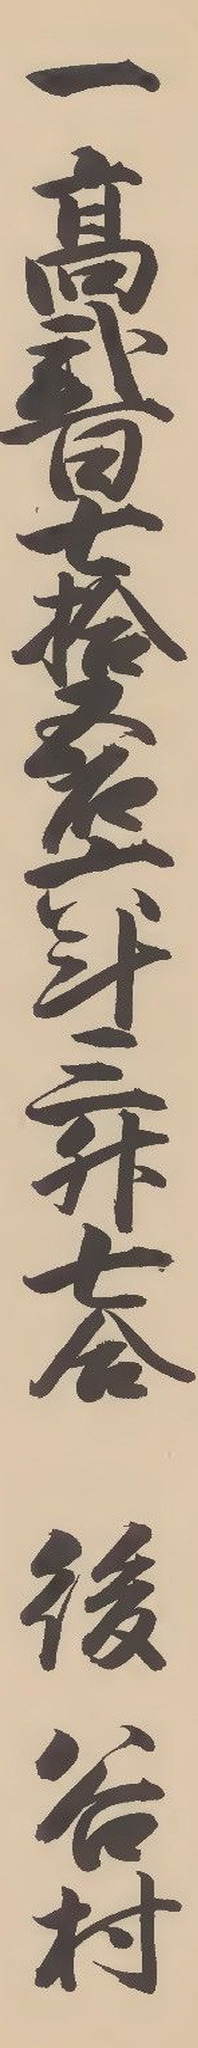一高弐百七拾五石六斗三升七合後谷村
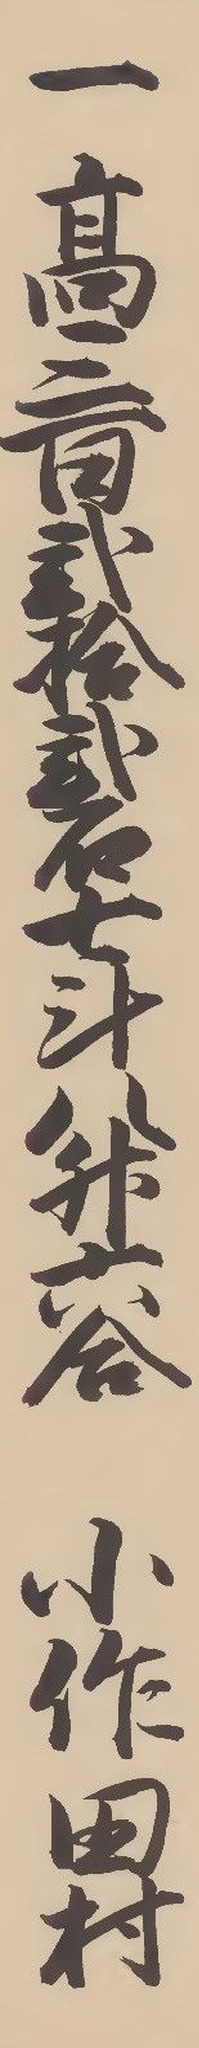一高三百弐拾弐石七斗八升六合小作田村

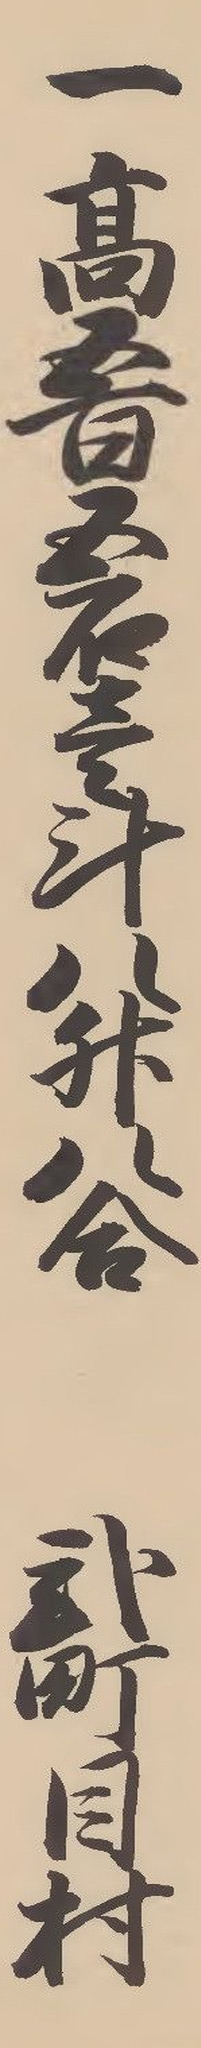一高五百五石壱斗八升八合弐町目村
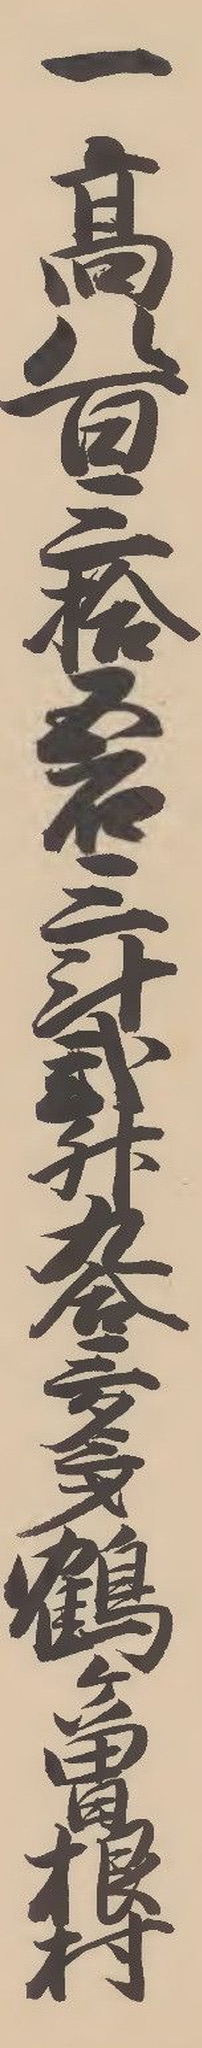一高八百三拾五石三斗弐升九合三勺三才鶴ヶ曽根村
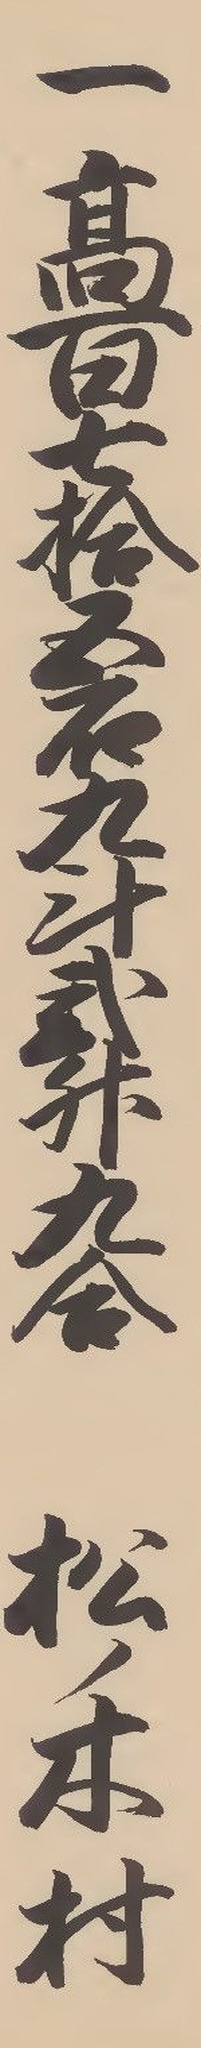一高百七拾五石九斗弐升九合松ノ木村
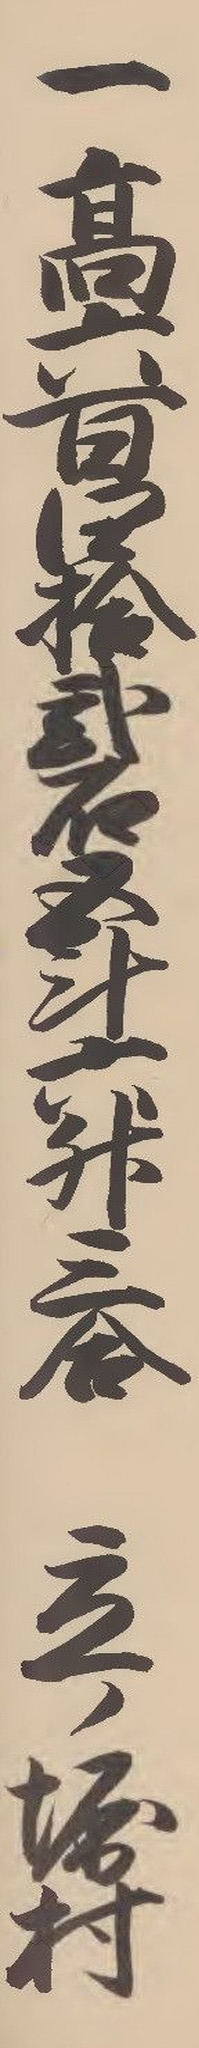一高六百四拾弐石五斗六升三合立ノ堀村
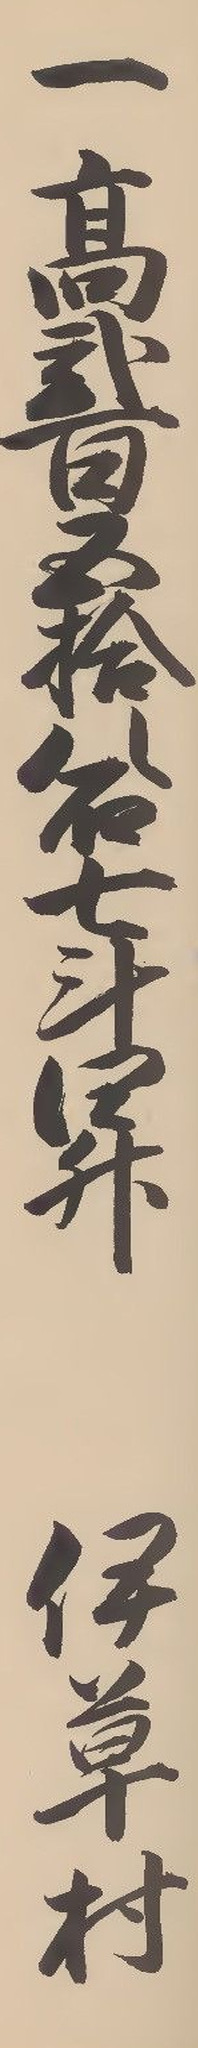一高弐百五拾八石七斗四升伊草村
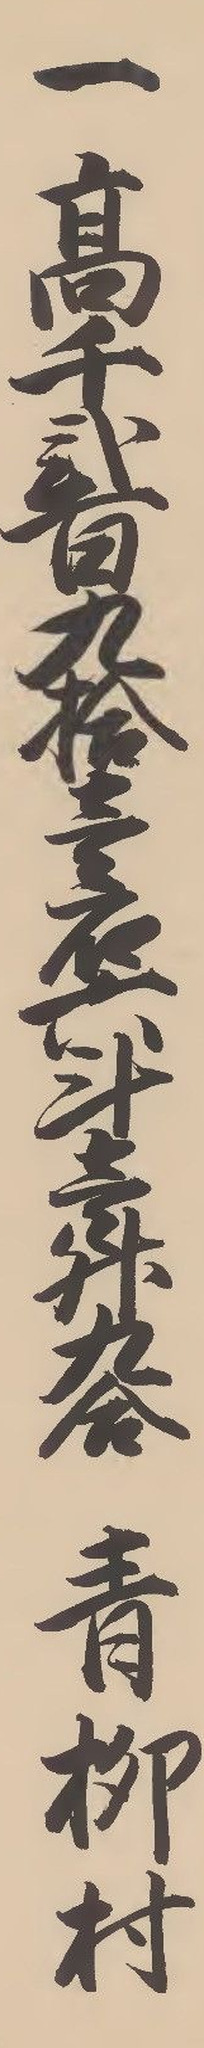一高千弐百九拾壱石六斗壱升九合青柳村
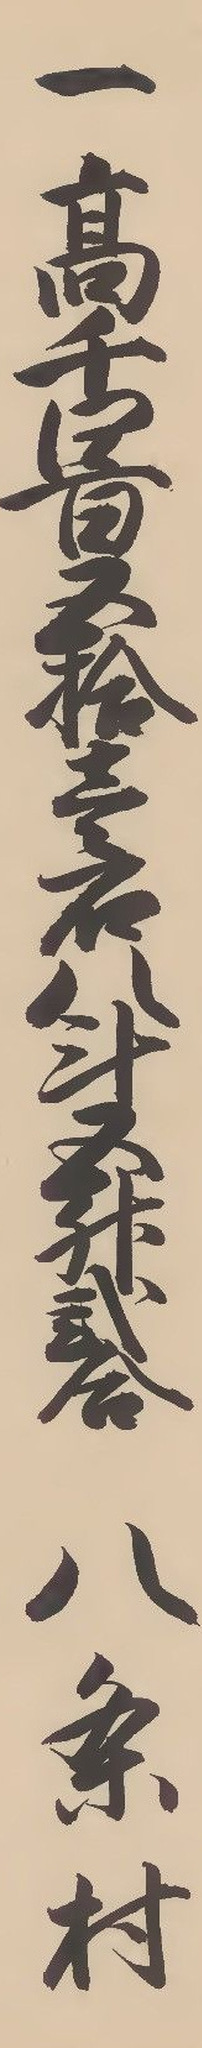一高千四百五拾壱石八斗五升弐合八条村
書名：武蔵国郷帳　下
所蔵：国立公文書館 National Archives of Japan
